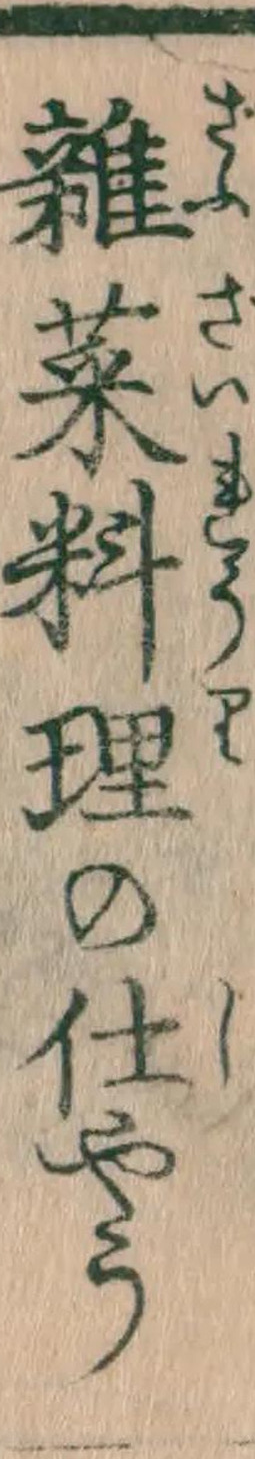雑菜料理の仕やう
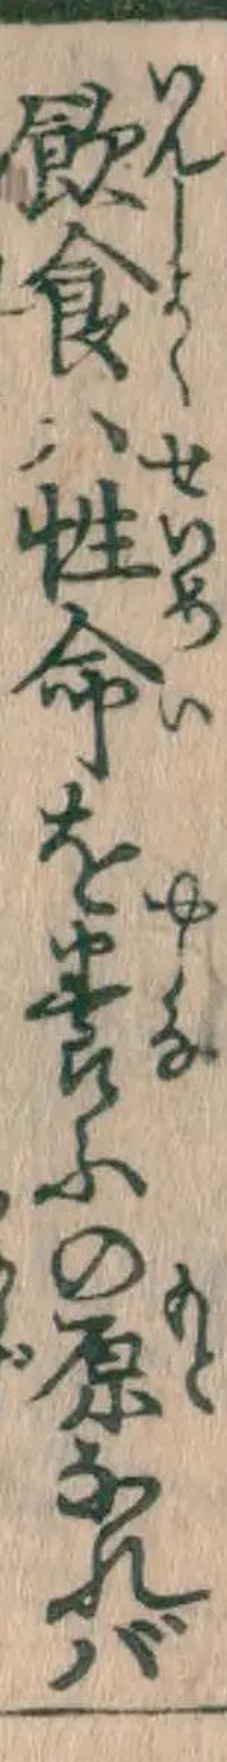飲食は性命を養ふの原なれば
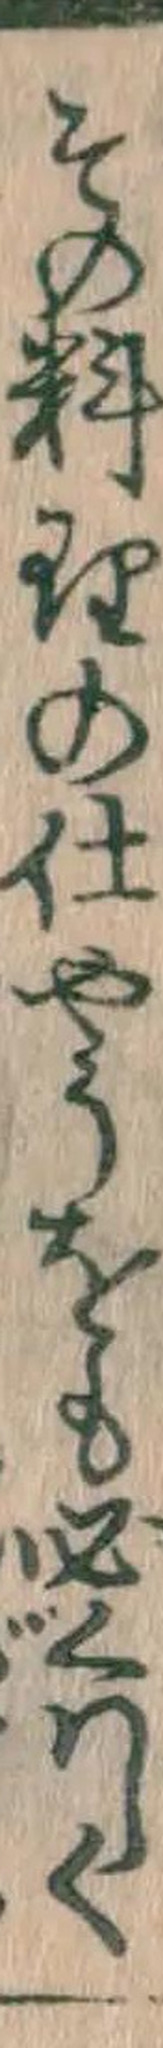その料理の仕やうをも必くはしく
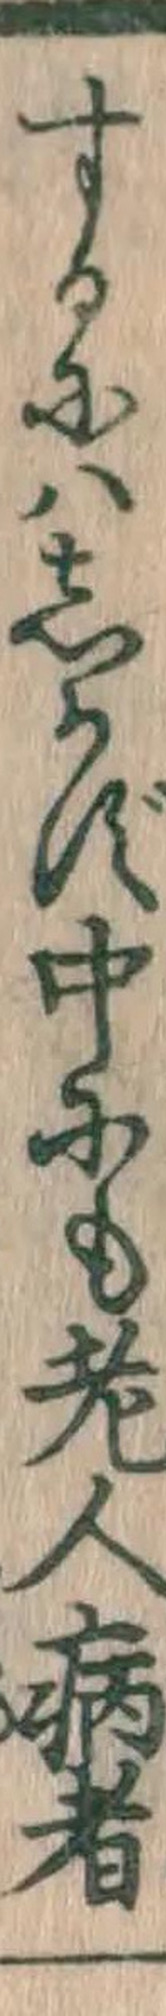するにはしかず中にも老人病者
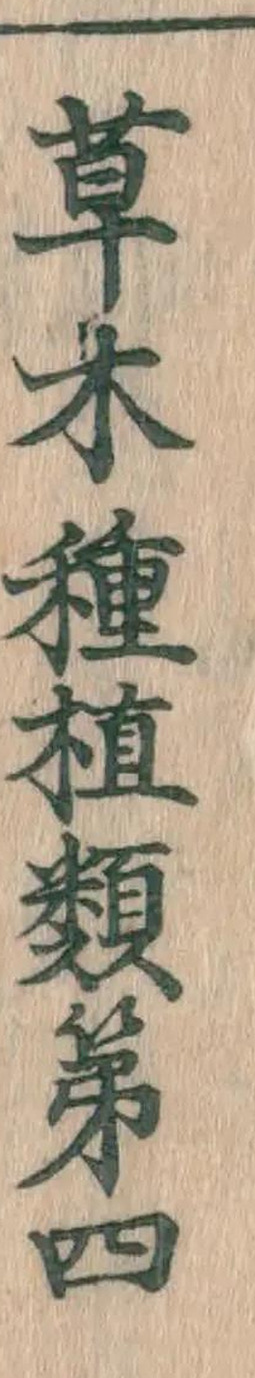草木種植類第四
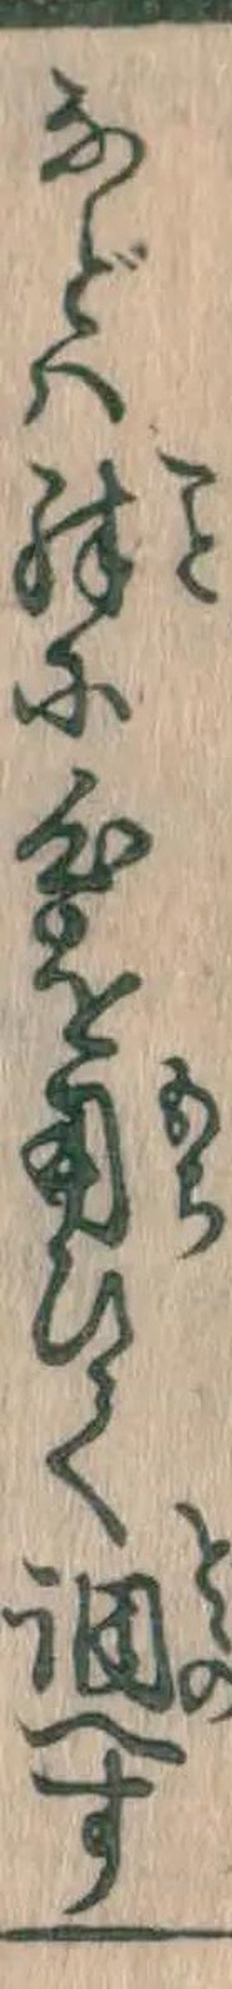などは殊に心を用ひて調へす
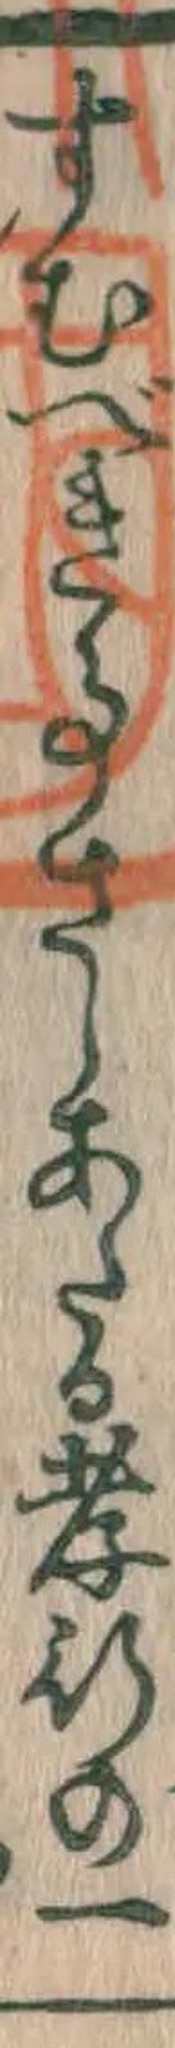すむべき事さしあたる孝行の一
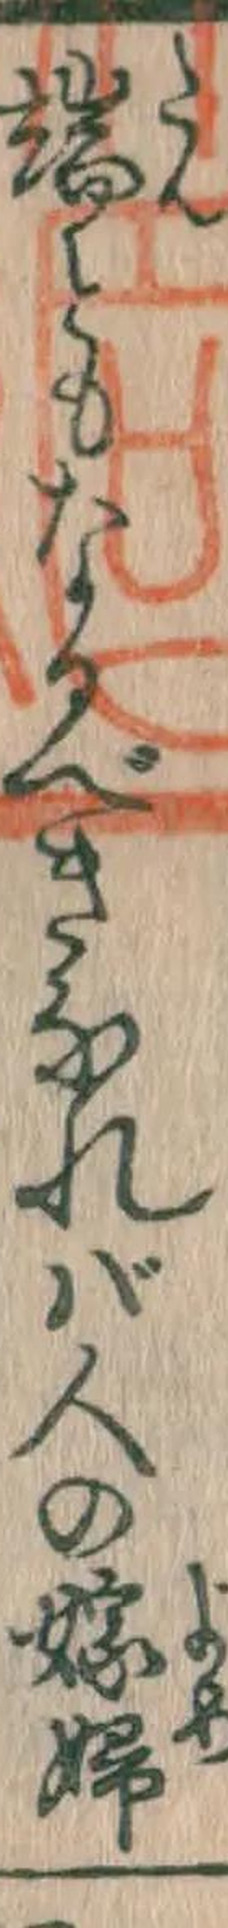端ともなるべきなれば人の嫁婦
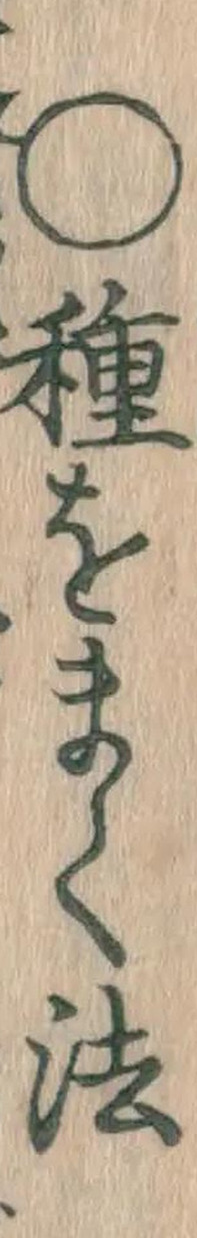○種をまく法
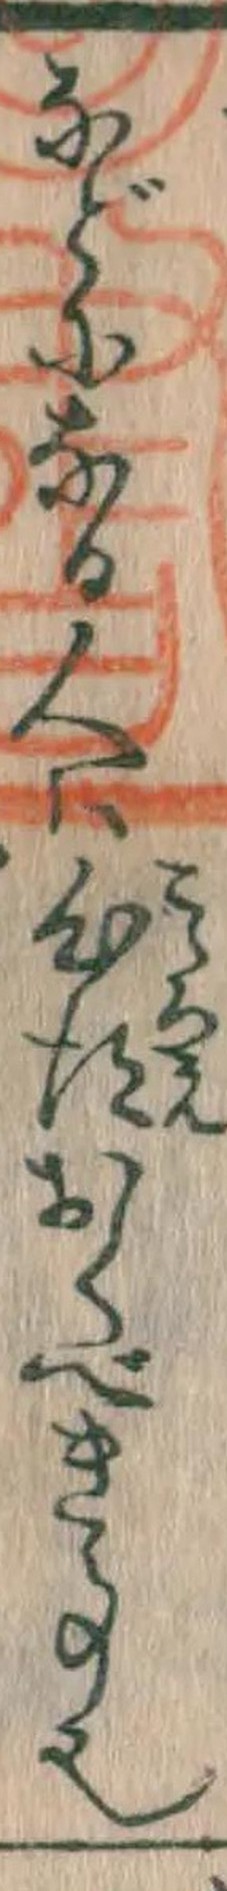などになる人は心得おくべき事也
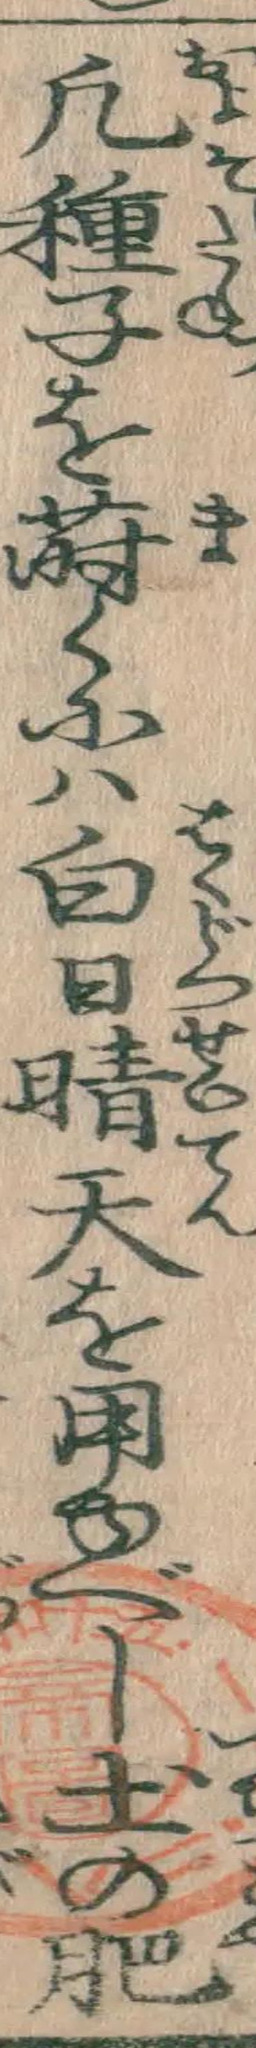凡種子を蒔くには白日晴天を用ゆべし土の肥
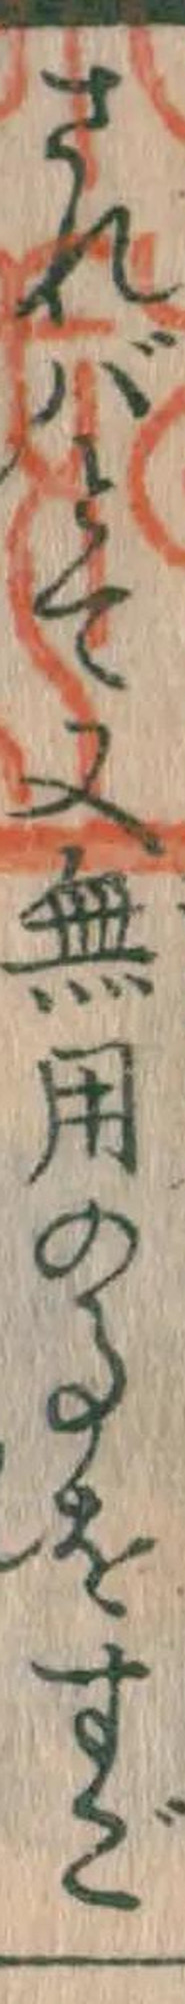さればとて又無用の事をすご
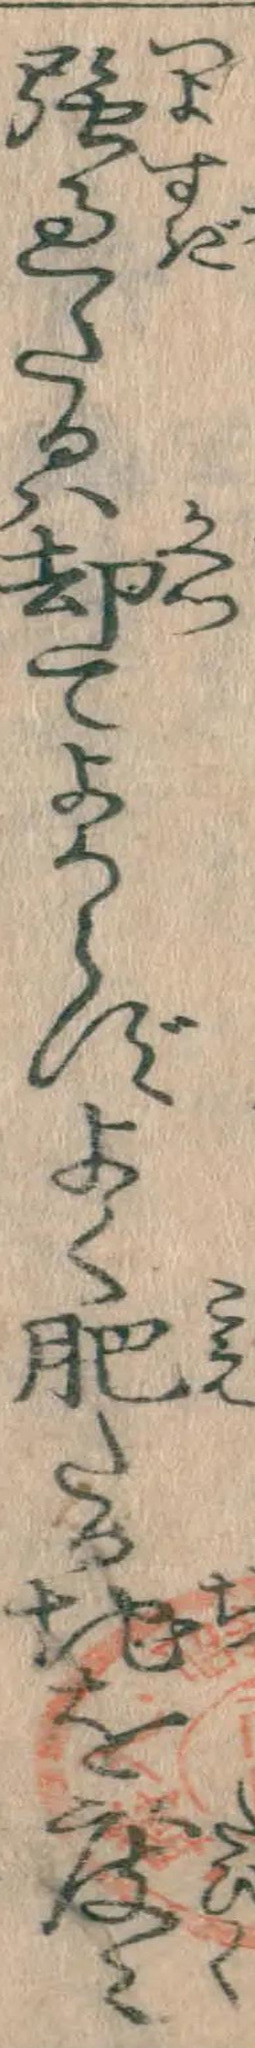強過たるは却てよからずよく肥たる地を度々
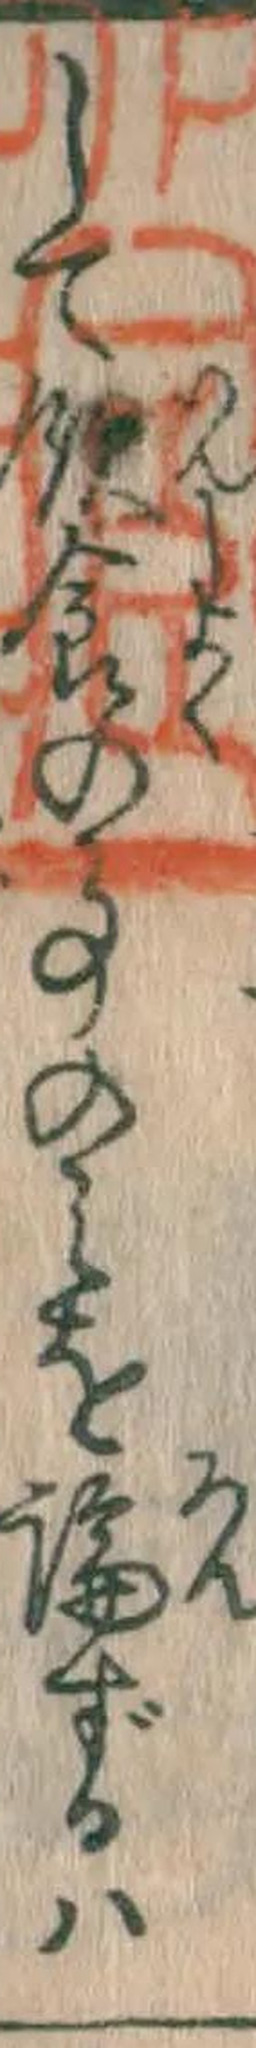して飲食の事のみを論ずるは
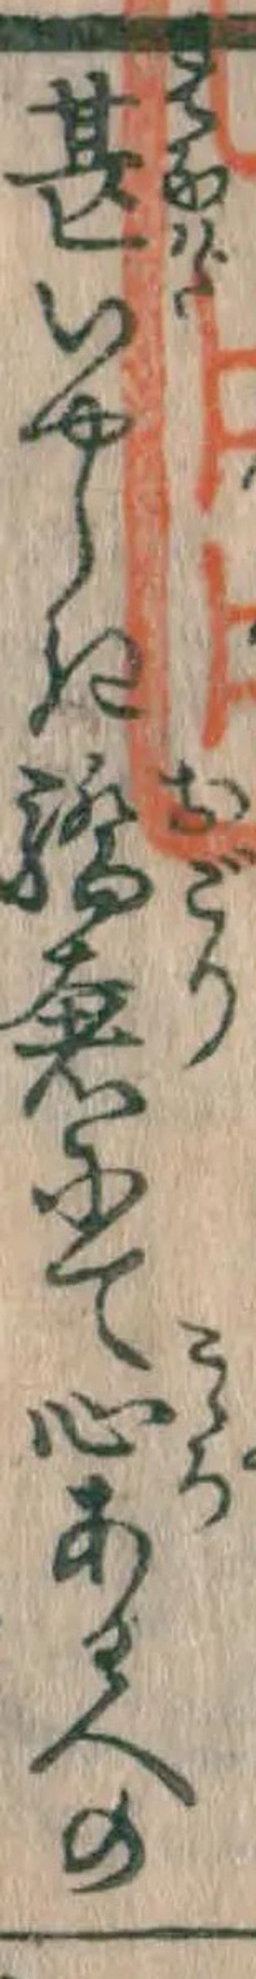甚いやしき驕奢にて心ある人の
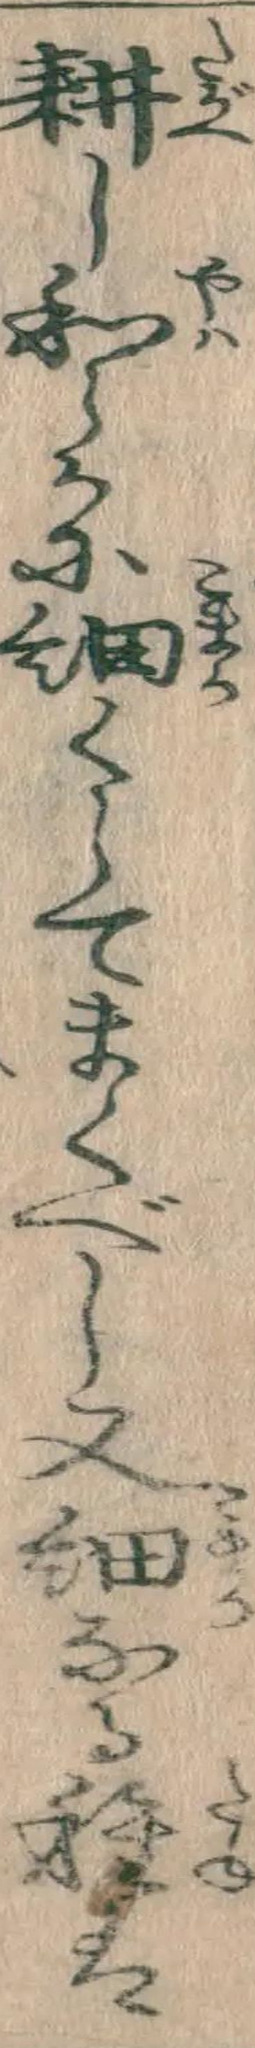耕し和らかに細くしてまくべし又細なる種は
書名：広益秘事大全 3巻. [5]
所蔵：国立国会図書館 National Diet Library, JAPAN
